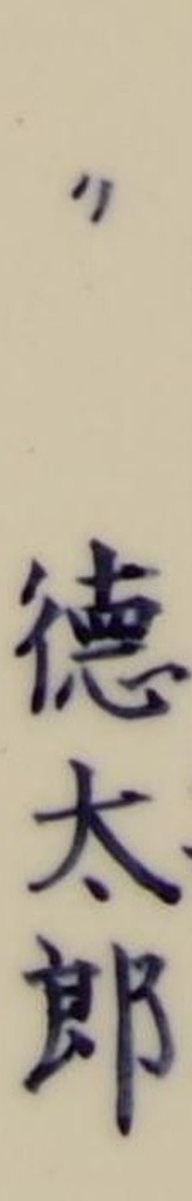徳太郎
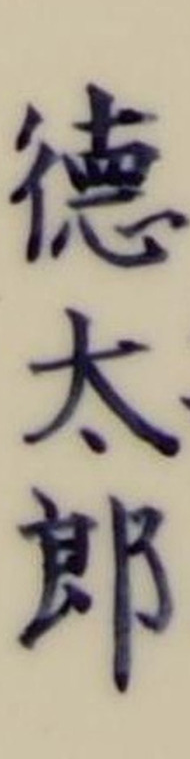徳太郎
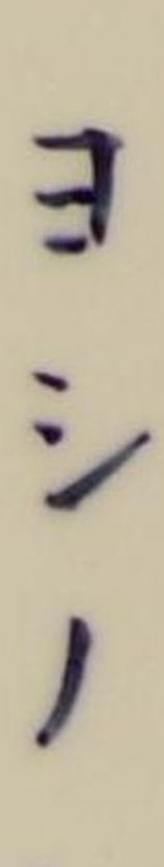ヨシノ
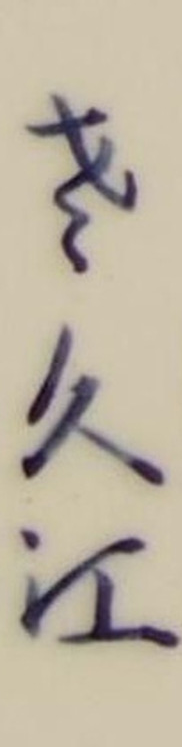さく江

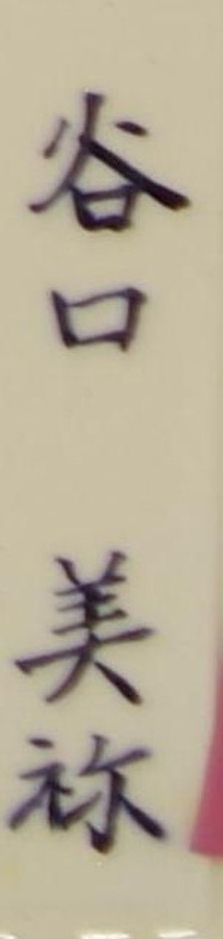谷口美祢
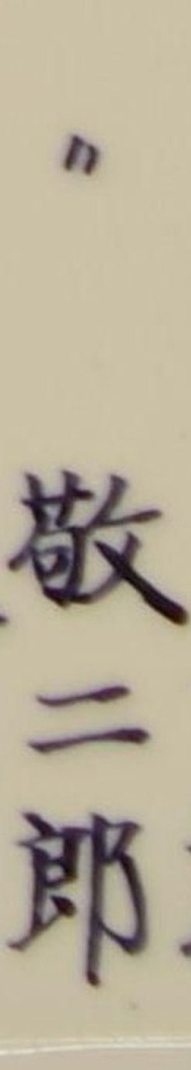敬二郎
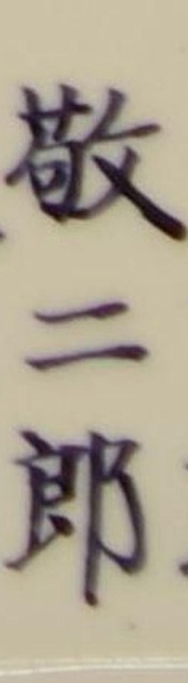敬二郎
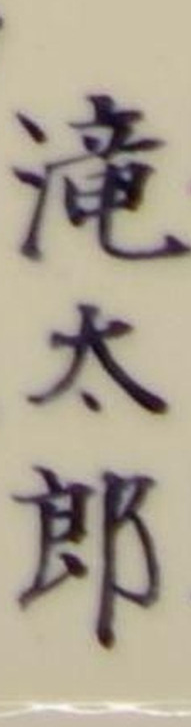滝太郎
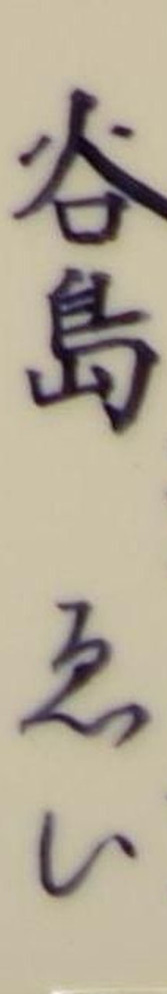谷島ゑい
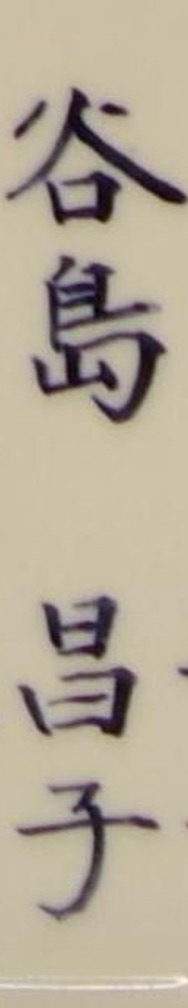谷島昌子
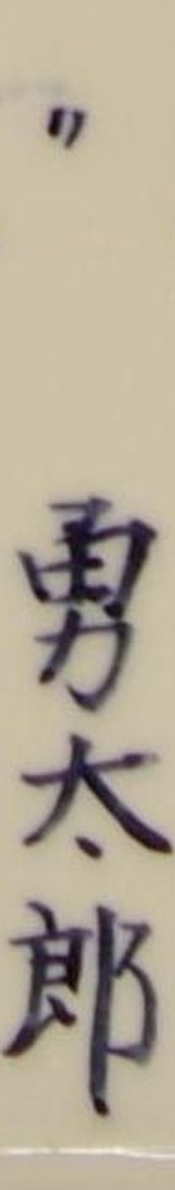勇太郎
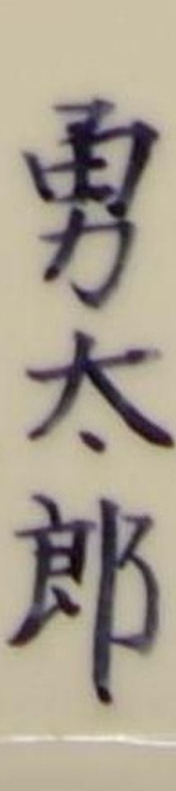勇太郎
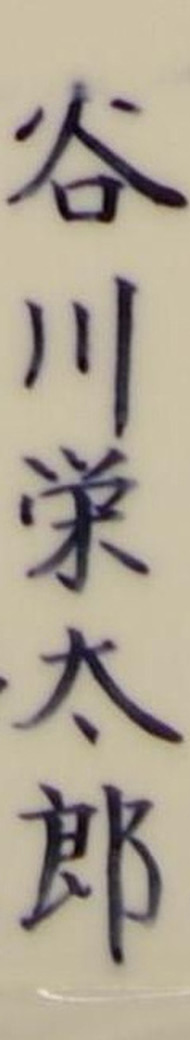谷川栄太郎
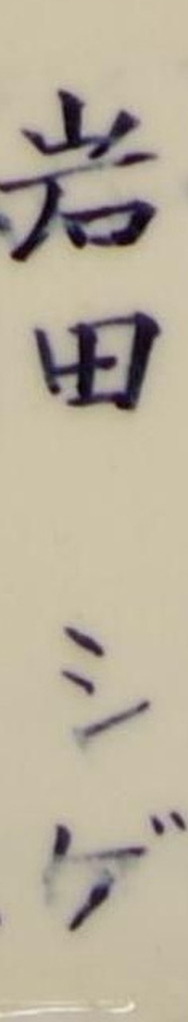岩田シゲ
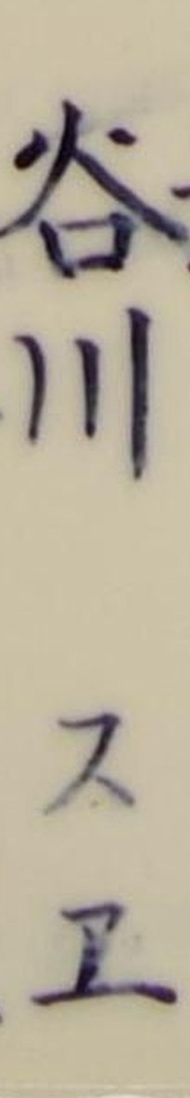谷川スヱ
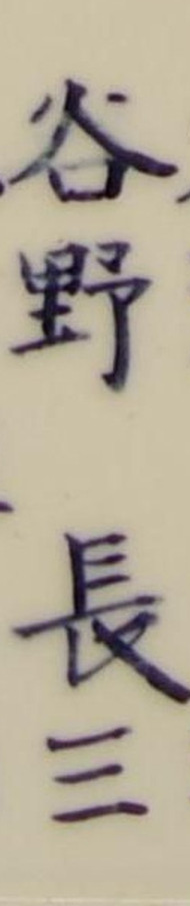谷野長三
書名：A~D
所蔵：koyasan kongobuji
